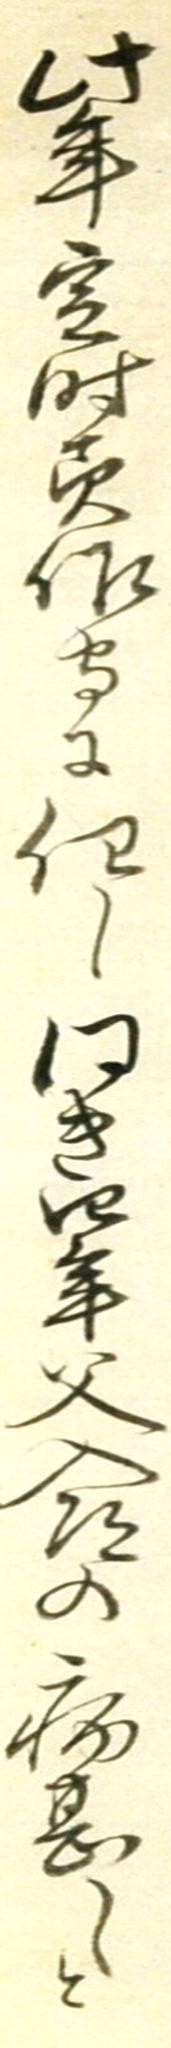此年定時美作守に任し同き四年父入道の病甚しと
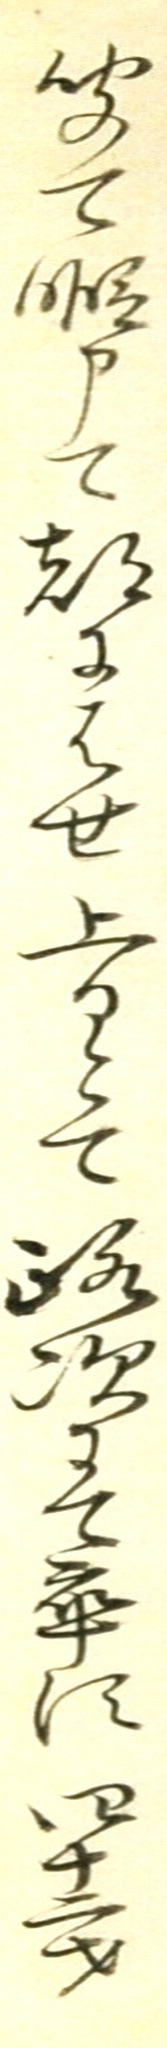聞て暇申て都にはせ上るとて路次にて卒す四十二歳

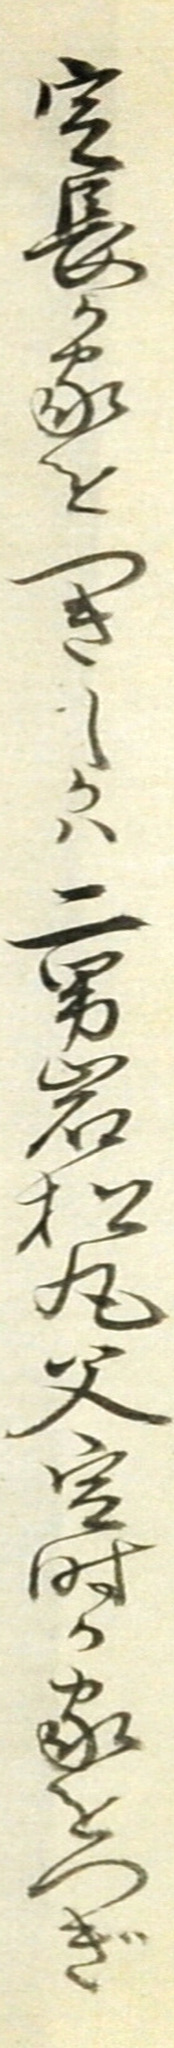定長か家をつきしかは二男岩松丸父定時か家をつぎ
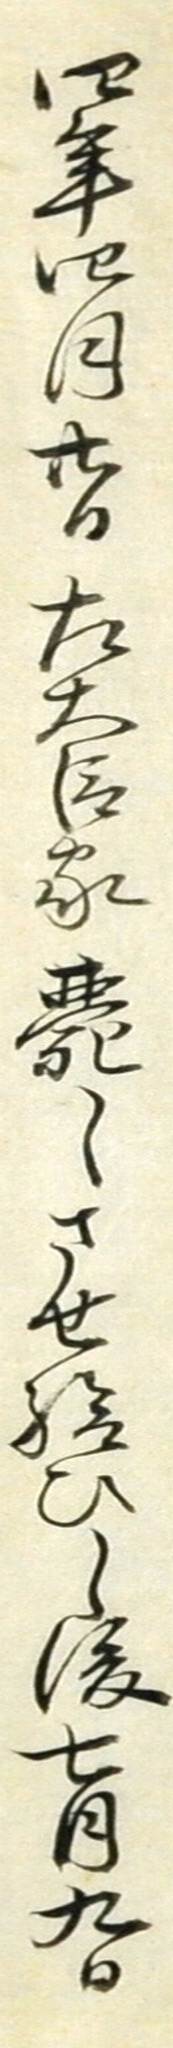四年四月廿日左大臣家薨しさせ給ひし後七月九日
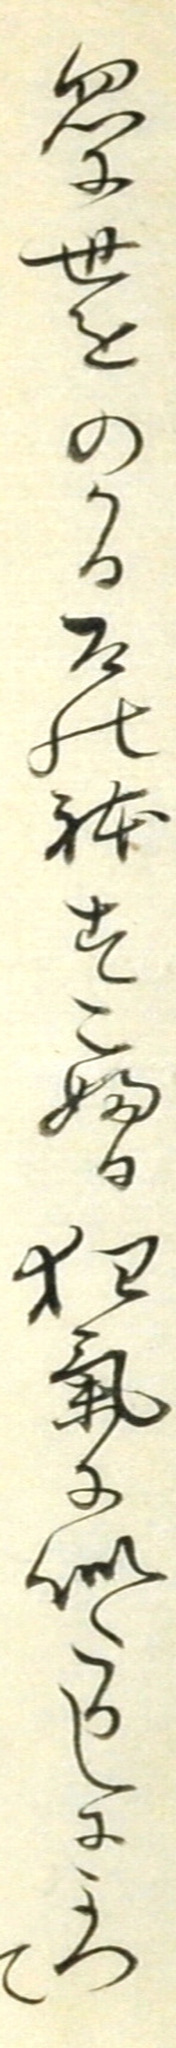忽に世をのかるその体すこふる狂気に似たりしによつて

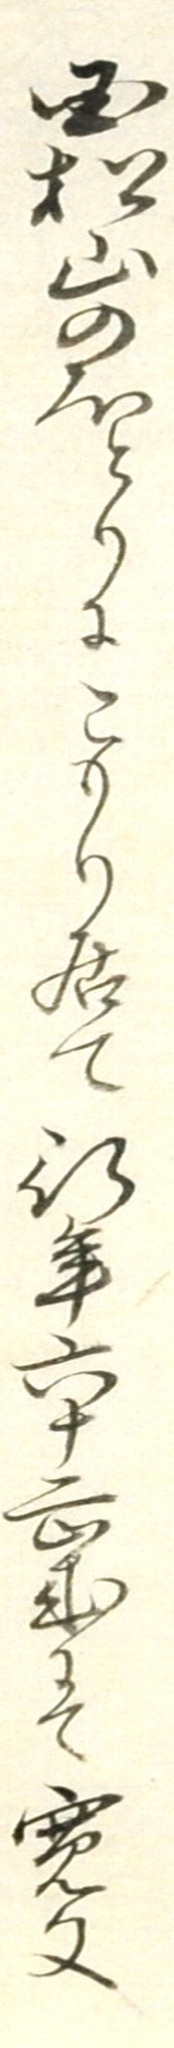国松山のほとりにこもり居て行年六十二歳にて寛文

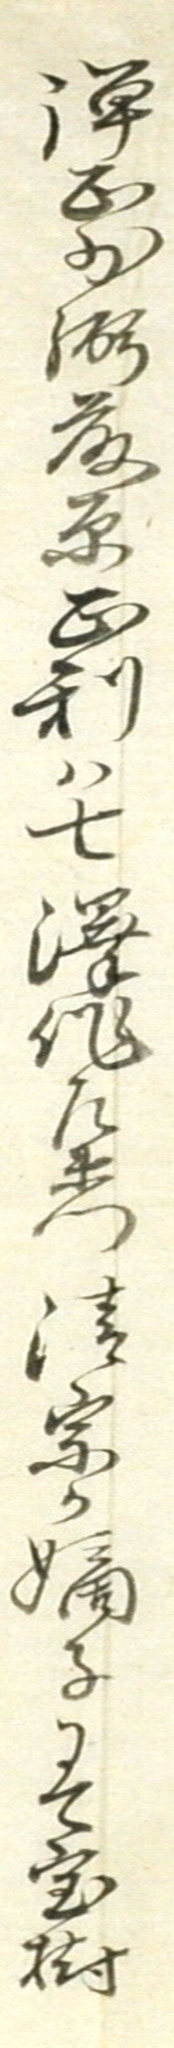弾正少弼藤原正利は七沢作左衛門清宗か嫡子にて宝樹
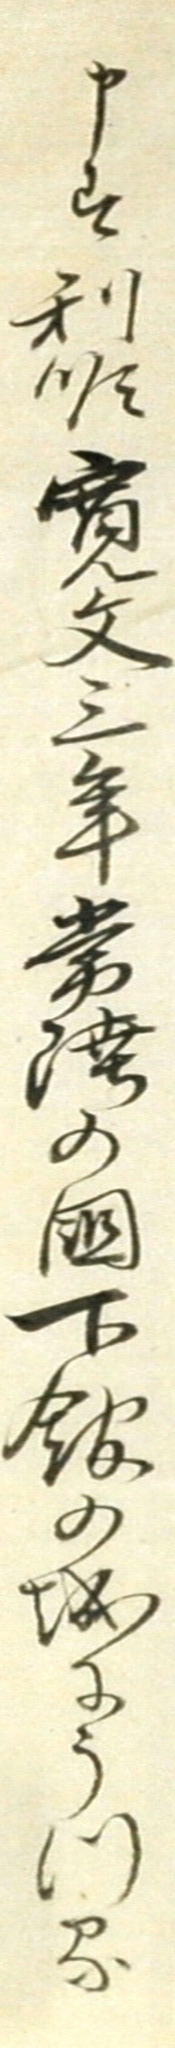申す利順寛文三年常陸の国下館の城にうつる
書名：藩翰譜（二・三）
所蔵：伊那市立高遠町図書館・合同会社AMANE
